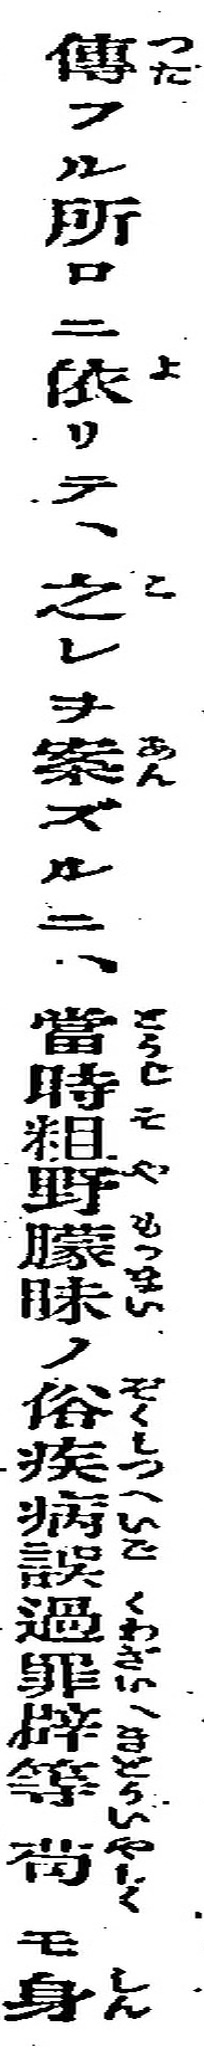伝フル所ロニ依リテ、之レヲ案ズルニ、当時粗野朦眛ノ俗疾病誤過罪辟等苟モ身
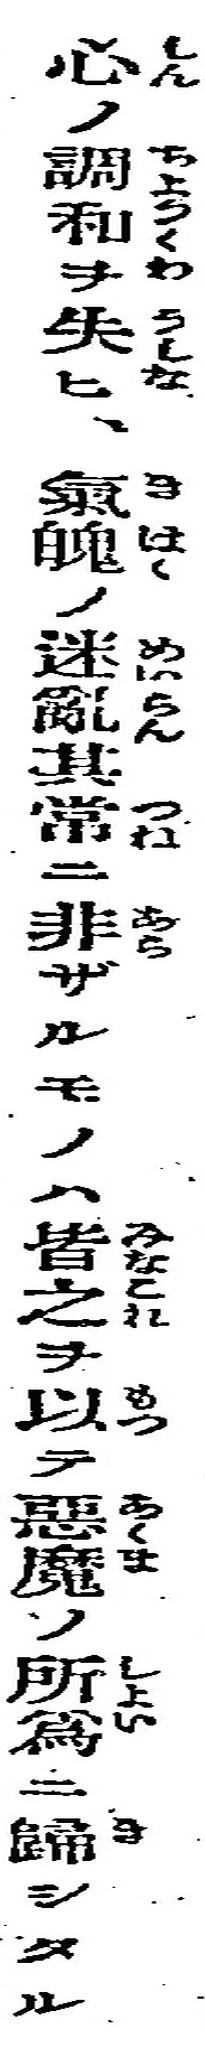心ノ調和ヲ失ヒ、気魄ノ迷乱其常ニ非ザルモノハ皆之ヲ以テ悪魔ノ所為ニ帰シタル
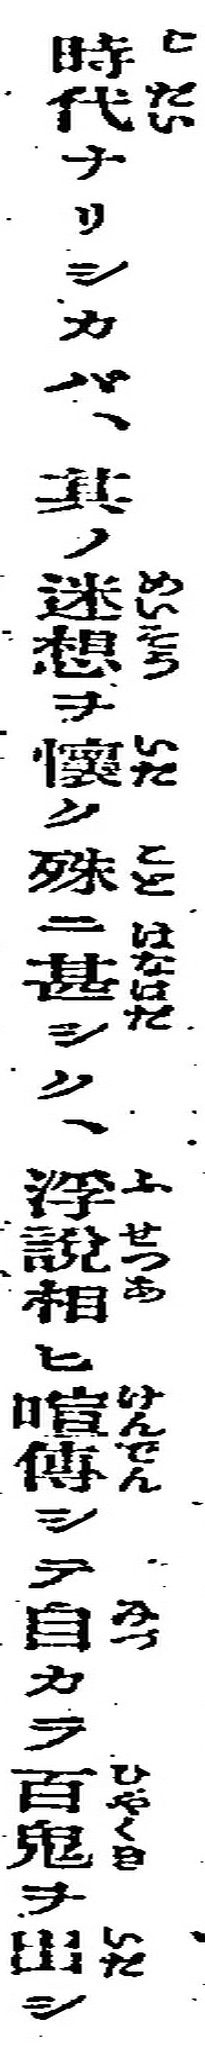時代ナリシカバ、其ノ迷想ヲ懐ク殊ニ甚シク、浮説相ヒ喧伝シテ自カラ百鬼ヲ出シ

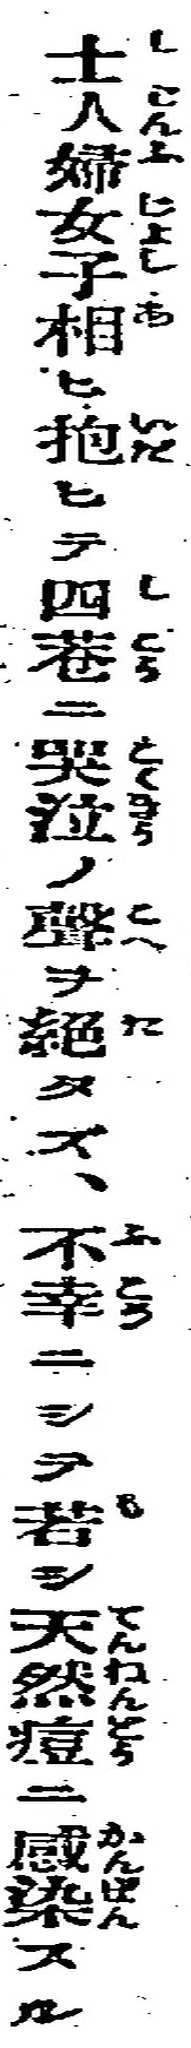士人婦女子相ヒ抱ヒテ四巷ニ哭泣ノ声ヲ絶タズ、不幸ニシテ若シ天然痘ニ感染スル
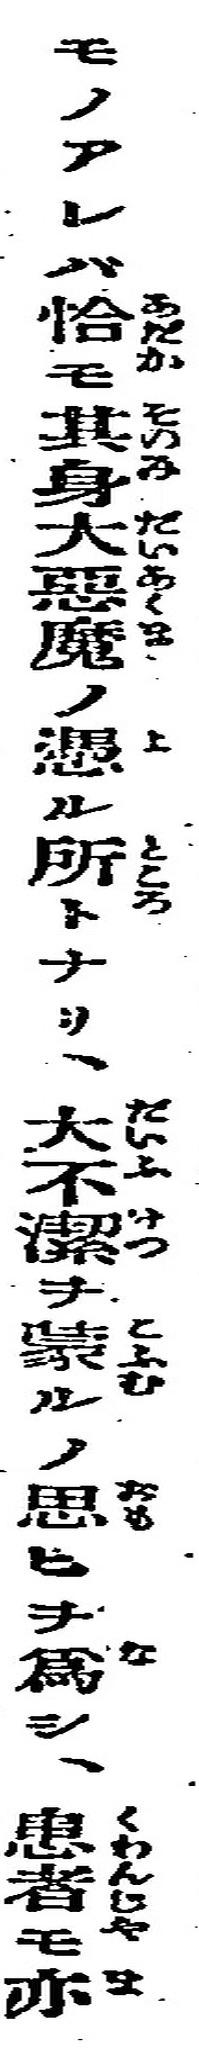モノアレバ恰モ其身大悪魔ノ憑ル所トナリ、大不潔ヲ蒙ルノ思ヒヲ為シ、患者モ亦
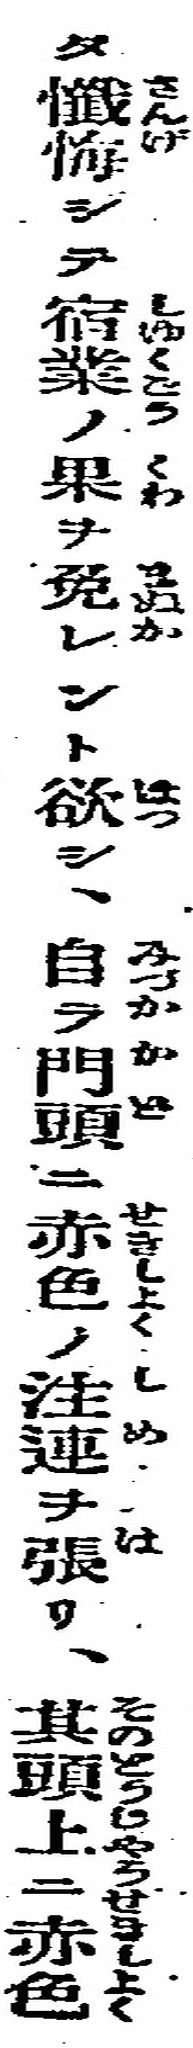タ懺悔シテ宿業ノ果ヲ免レント欲シ、自ラ門頭ニ赤色ノ注連ヲ張リ、其頭上ニ赤色
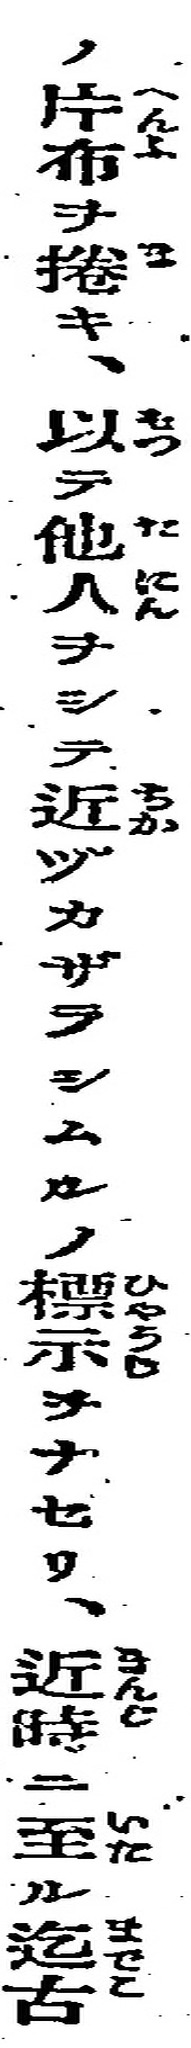ノ片布ヲ捲キ、以テ他人ヲシテ近ヅカザラシムルノ標示ヲナセリ、近時ニ至ル迄古
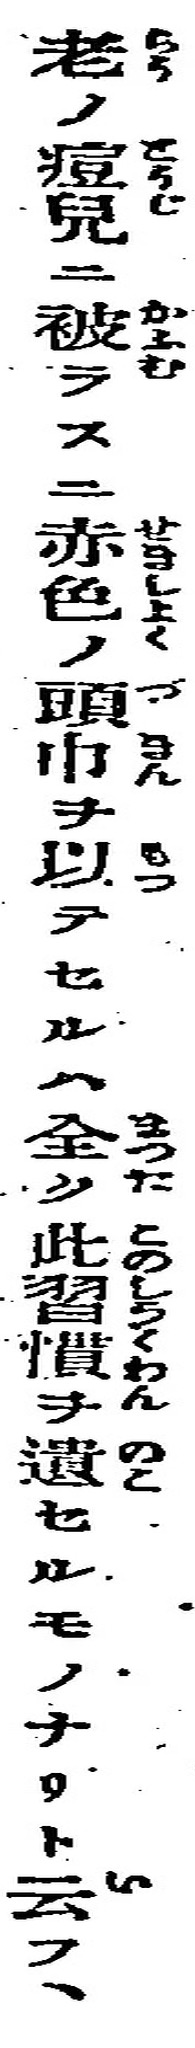老ノ痘児ニ被ラスニ赤色ノ頭巾ヲ以テセルハ全ク此習慣ヲ遺セルモノナリト云フ、
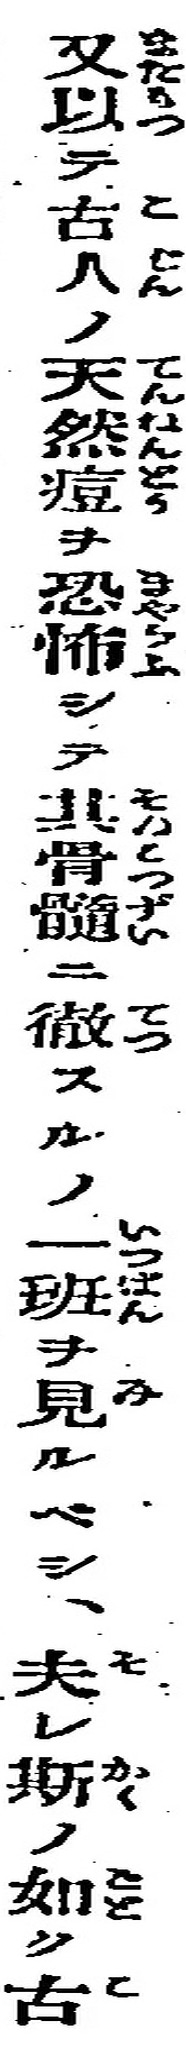又以テ古人ノ天然痘ヲ恐怖シテ其骨髄ニ徹スルノ一斑ヲ見ルベシ、夫レ斯ノ如ク古
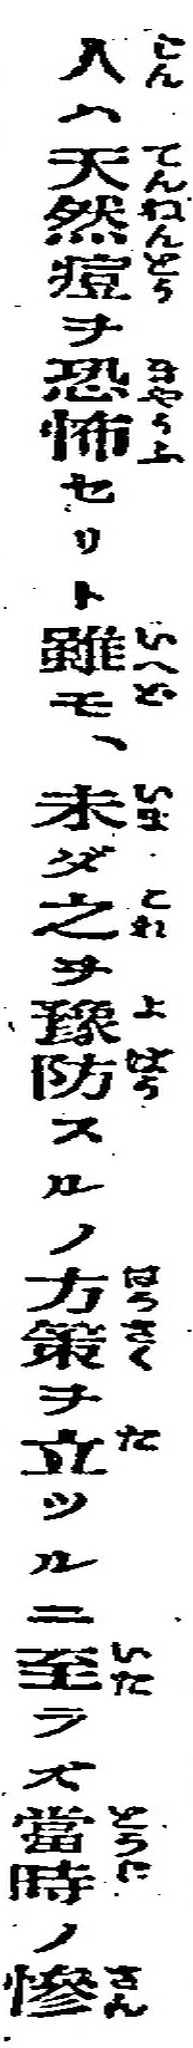人ハ天然痘ヲ恐怖セリト雖モ、未ダ之ヲ予防スルノ方策ヲ立ツルニ至ラズ当時ノ惨
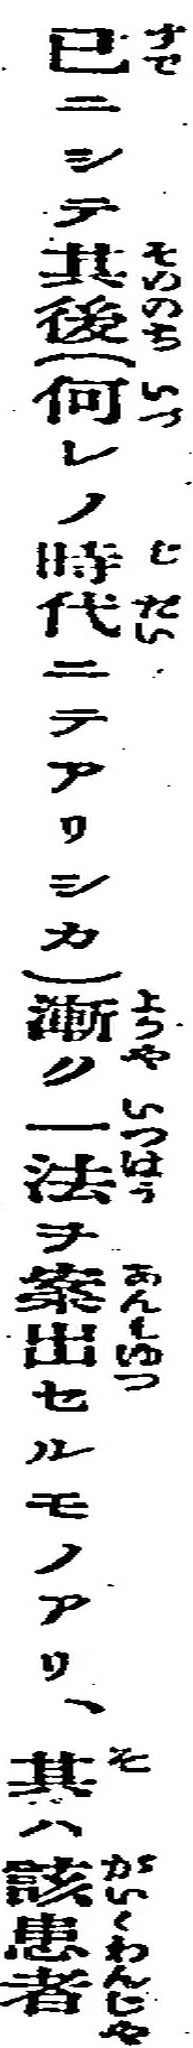已ニシテ其後(何レノ時代ニテアリシカ)漸ク一法ヲ案出セルモノアリ、其ハ該患者
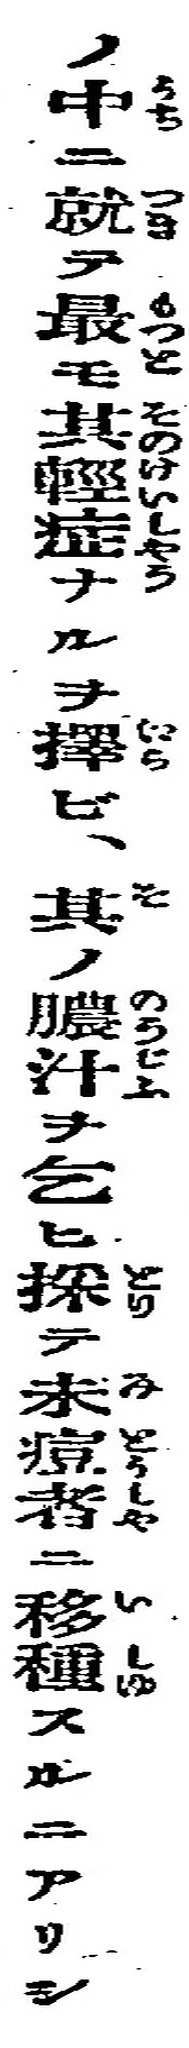ノ中ニ就テ最モ其軽症ナルヲ択ビ、其ノ膿汁ヲ乞ヒ採テ未痘者ニ移種スルニアリシ
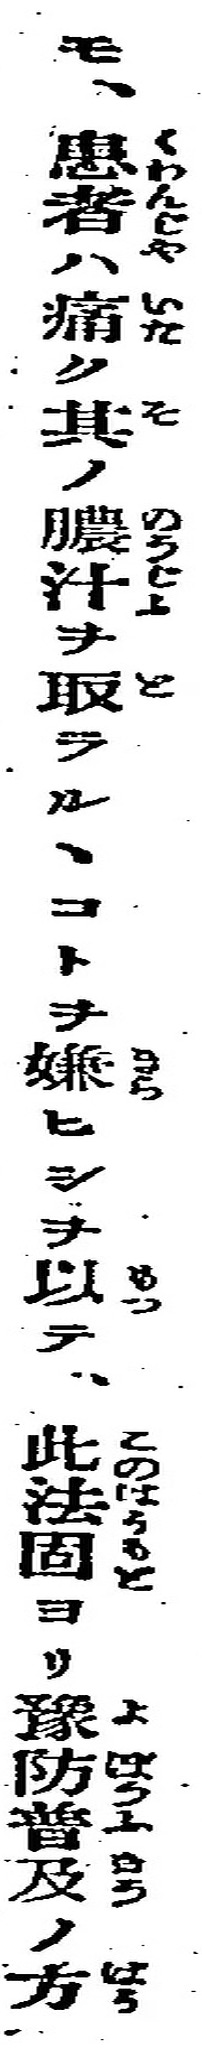モ、患者ハ痛ク其ノ膿汁ヲ取ラルヽコトヲ嫌ヒシヲ以テ、此法固ヨリ予防普及ノ方
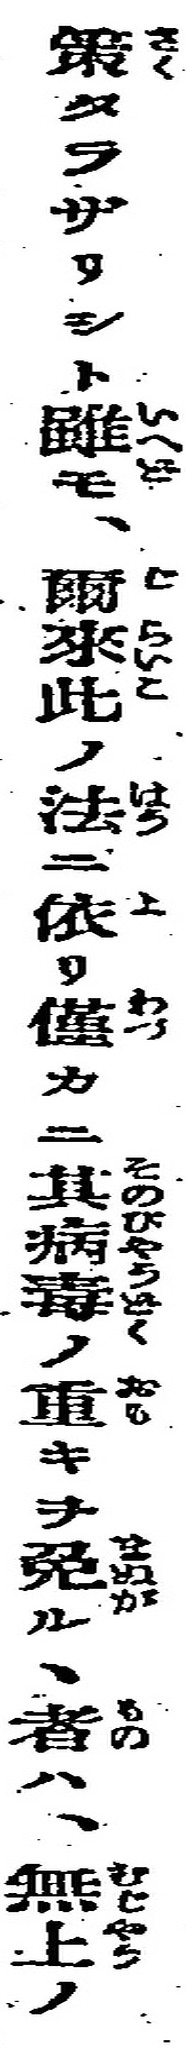策タラザリシト雖モ、爾來此ノ法ニ依リ僅カニ其病毒ノ重キヲ免ルヽ者ハ、無上ノ
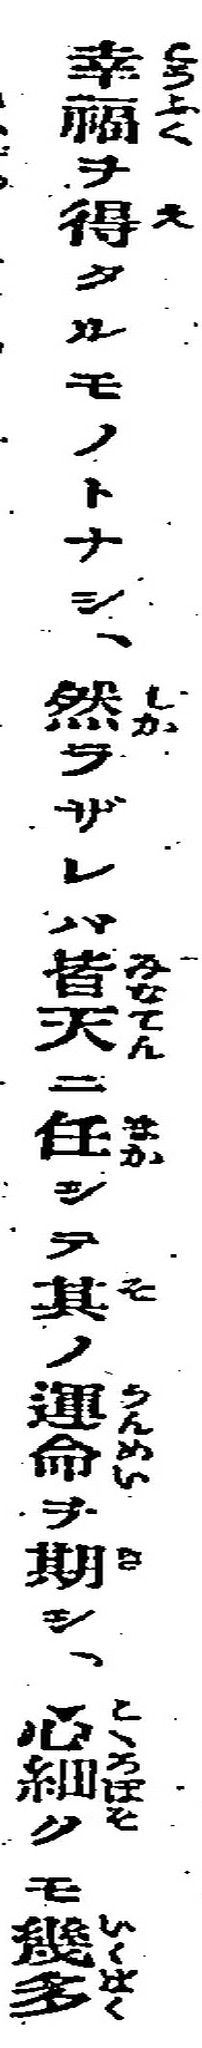幸福ヲ得タルモノトナシ、然ラザレバ皆天ニ任シテ其ノ運命ヲ期シ、心細クモ幾多
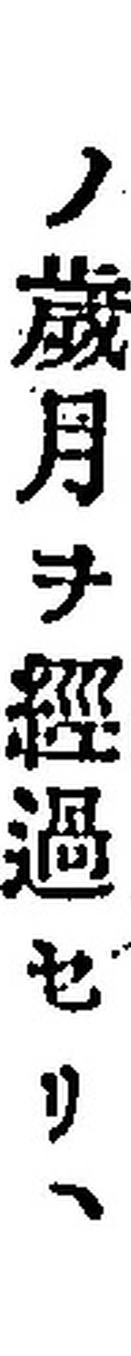ノ歳月ヲ経過セリ、
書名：天然痘予防注意兼種痘者之注意
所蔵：国立国会図書館 National Diet Library, JAPAN
